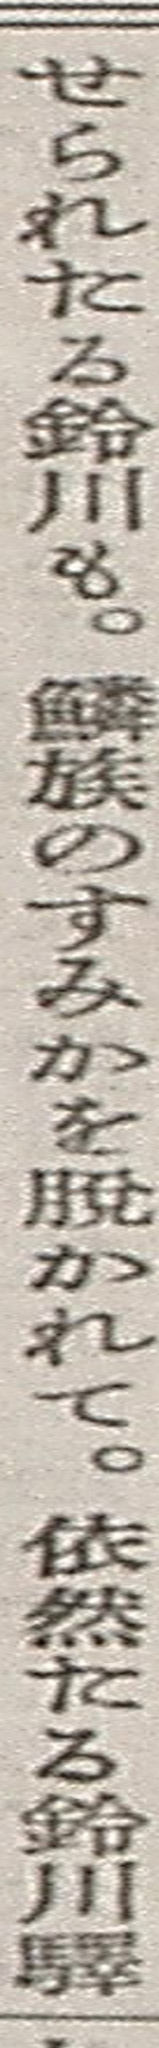せられたる鈴川も。鱗族のすみかを脱かれて。依然たる鈴川駅
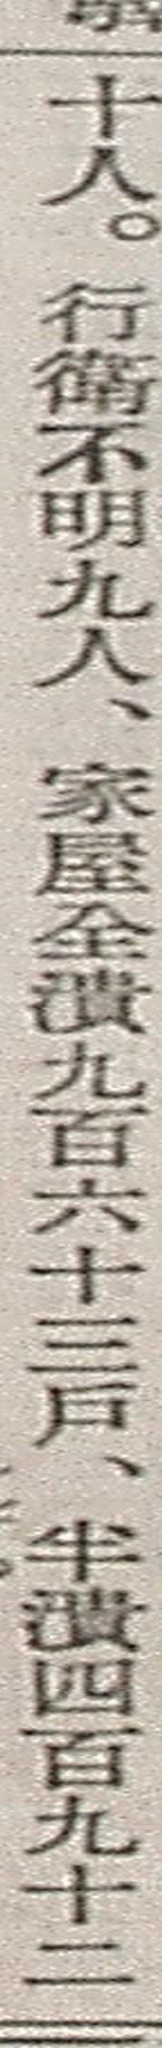十人。行衛不明九人、家屋全潰九百六十三戸、半潰四百九十二
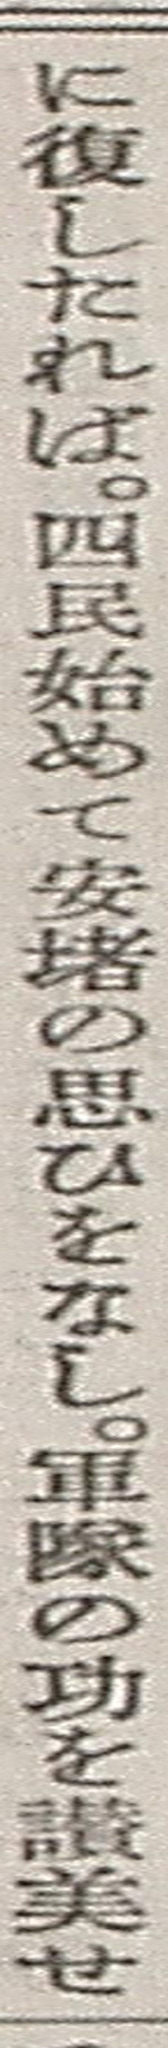に復したれば。四民始めて安堵の思ひをなし。軍隊の功を賛美せ
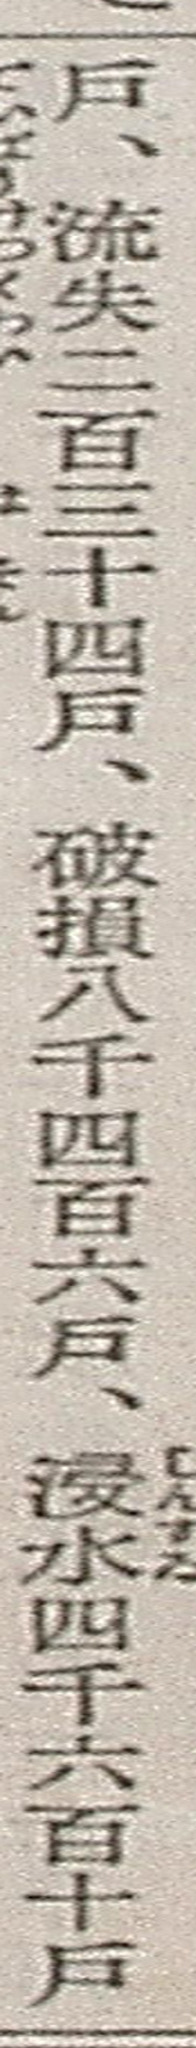戸、流失二百三十四戸、破損八千四百六戸、浸水四千六百十戸
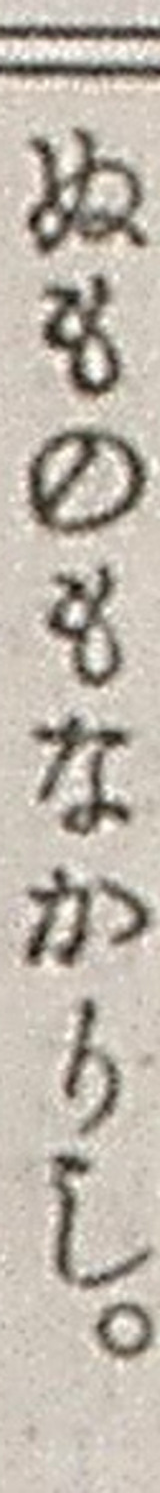ぬものなかりし。
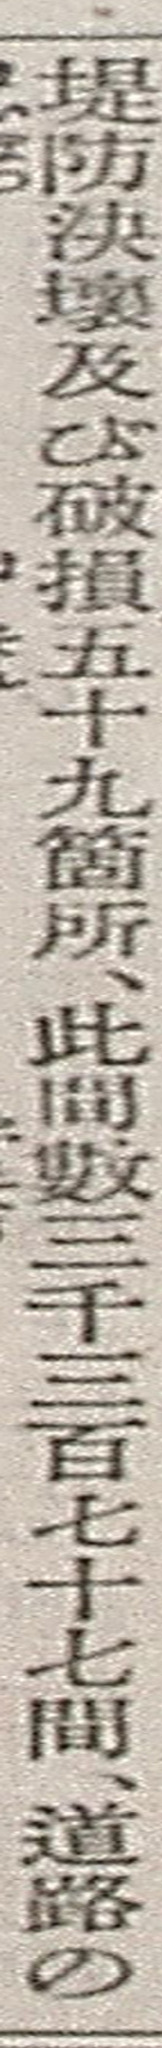堤防決壊及び破損五十九箇所、此間数三千三百七十七間、道路の
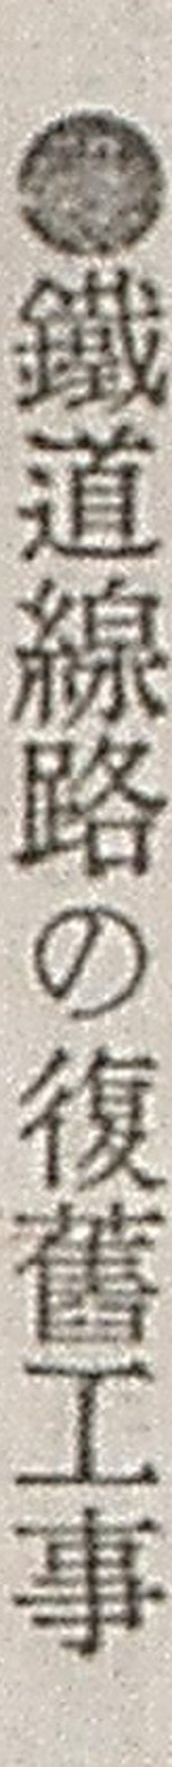●鉄道線路の復旧工事
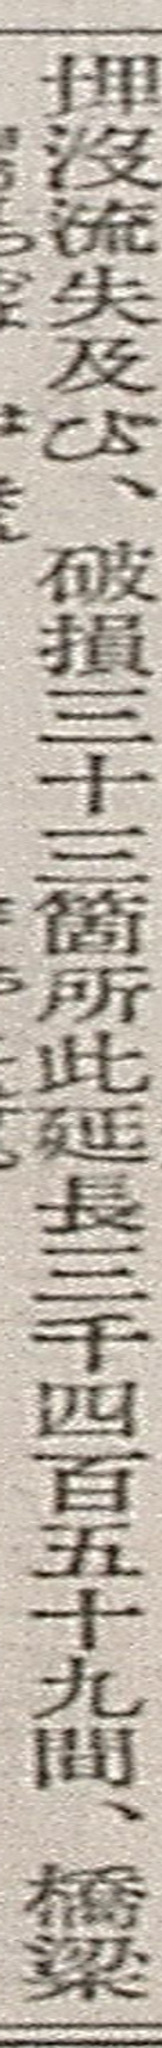埋没流失及び、破損三十三箇所此延長三千四百五十九間、橋梁
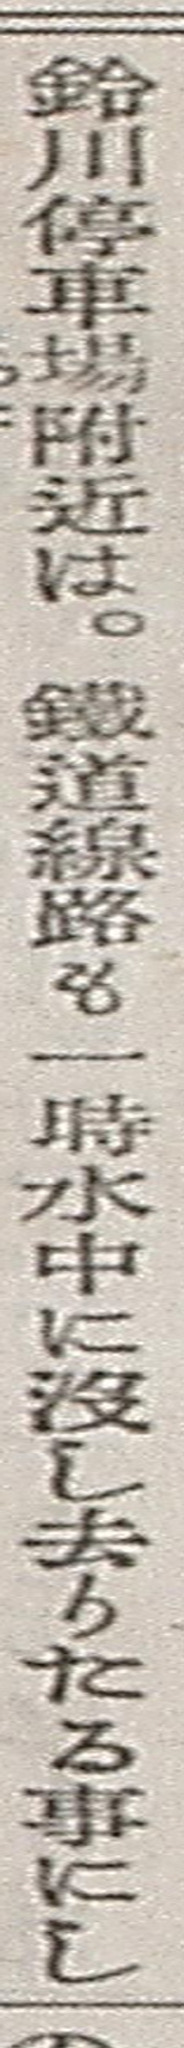鈴川停車場附近は。鉄道線路も一時水中に没し去りたる事にし
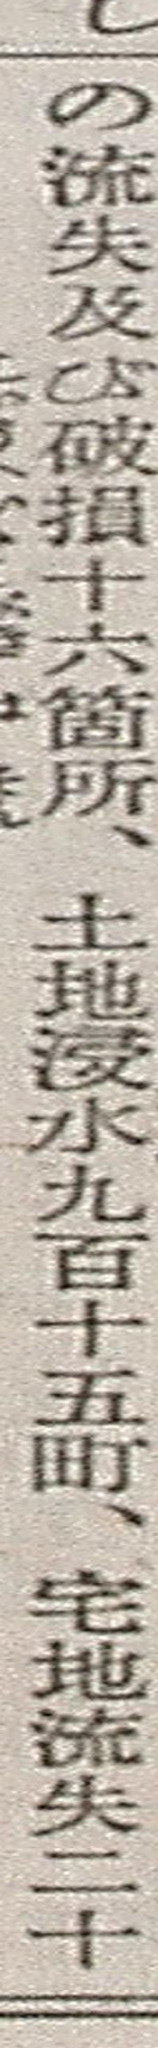の流失及び破損十六箇所、土地浸水九百十五町、宅地流失二十
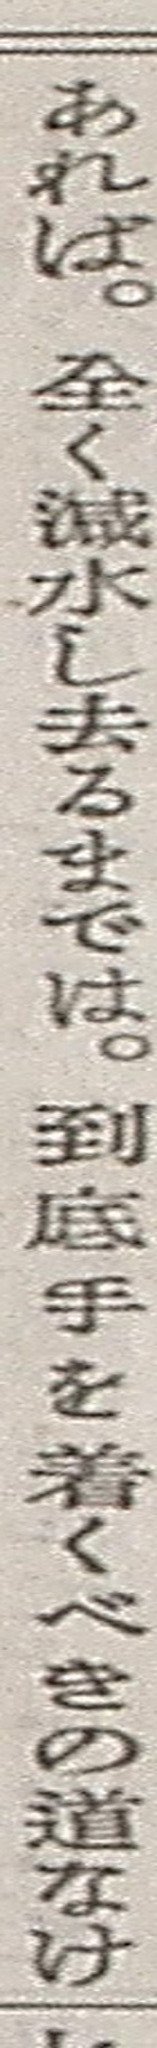あれば。全く減水し去るまでは。到底手を着くべきの道なけ
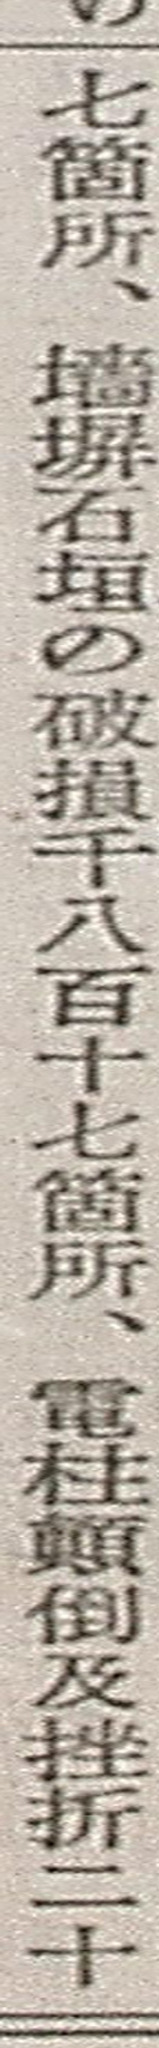七箇所、墻塀石垣の破損千八百十七箇所、電柱顚倒及挫折二十
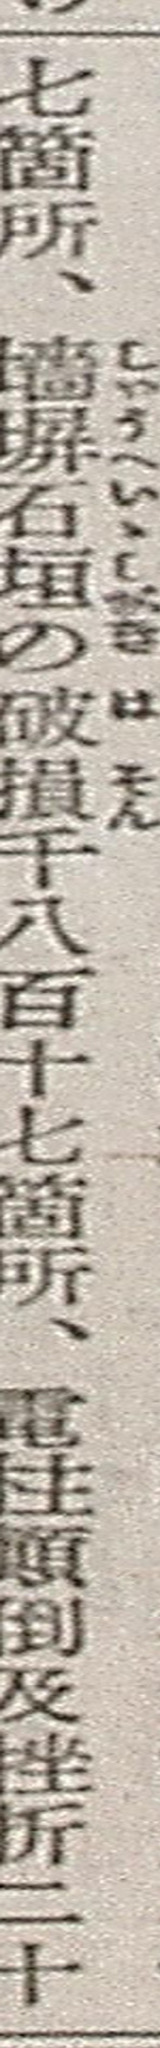七箇所、墻塀石垣の破損千八百十七箇所、電柱顚倒及挫折二十
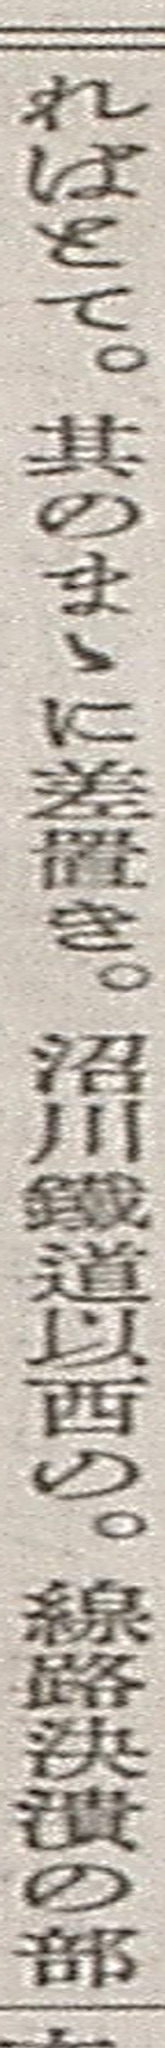ればとて。其のまゝに差置き。沼川鉄道以西の。線路決潰の部
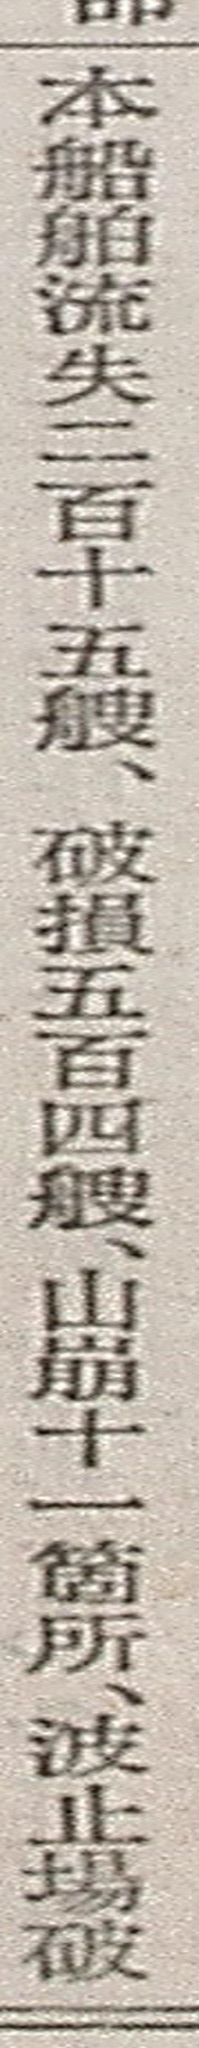本船舶流失二百十五艘、破損五百四艘、山崩十一箇所、波止場破
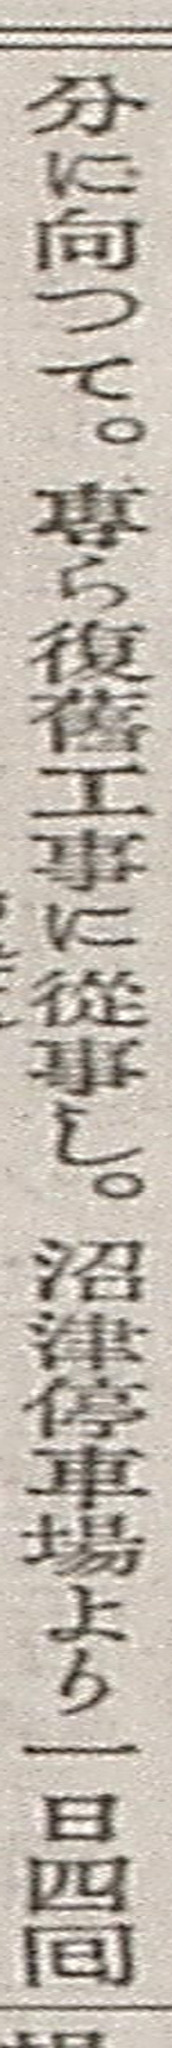分に向つて。専ら復旧工事に従事し。沼津停車場より一日四回
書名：風俗畫報臨時増刊第百九十九號　明治三十二年十月各地災害圖會（前編之續）
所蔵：東京大学地震研究所図書室 Earthquake Research Institute Library, The University of Tokyo, JAPAN
